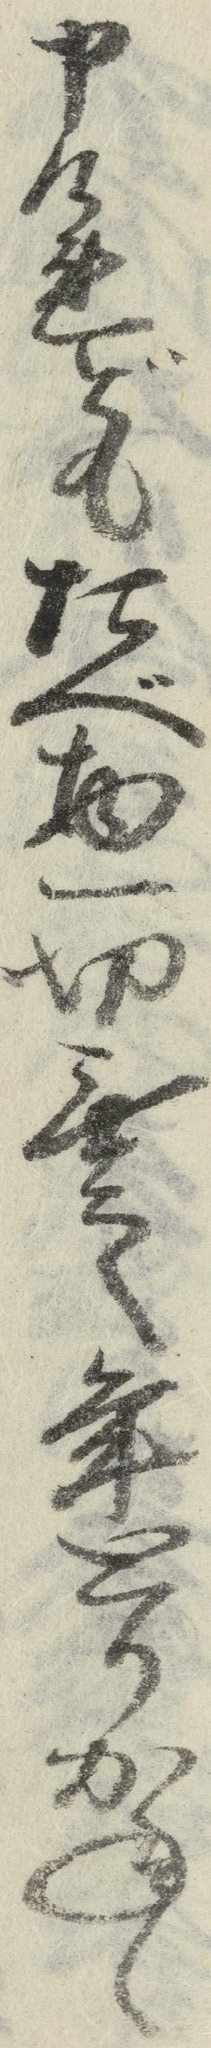申けれどもたべ物一切無之年とりかねし
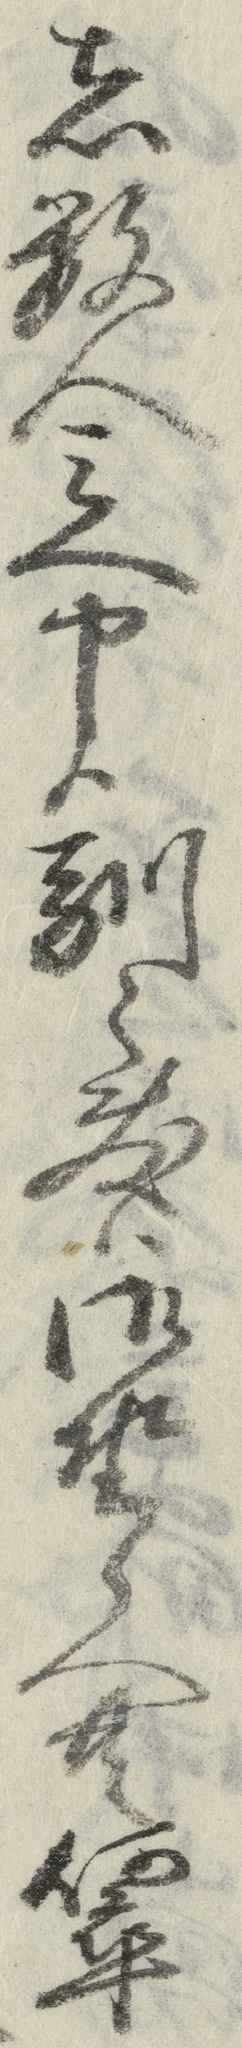者数人みへ申候馴々敷は御坐候へ共何卒
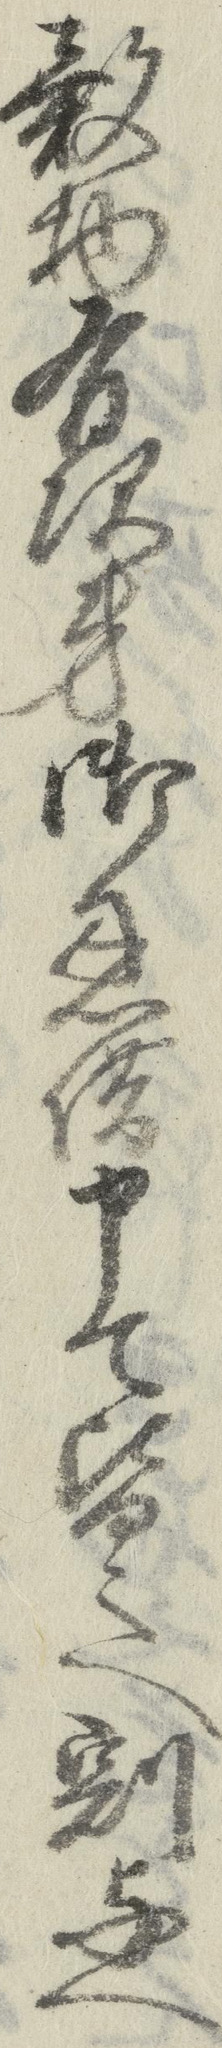穀物有次第御忍借申て皆々へ割与へ
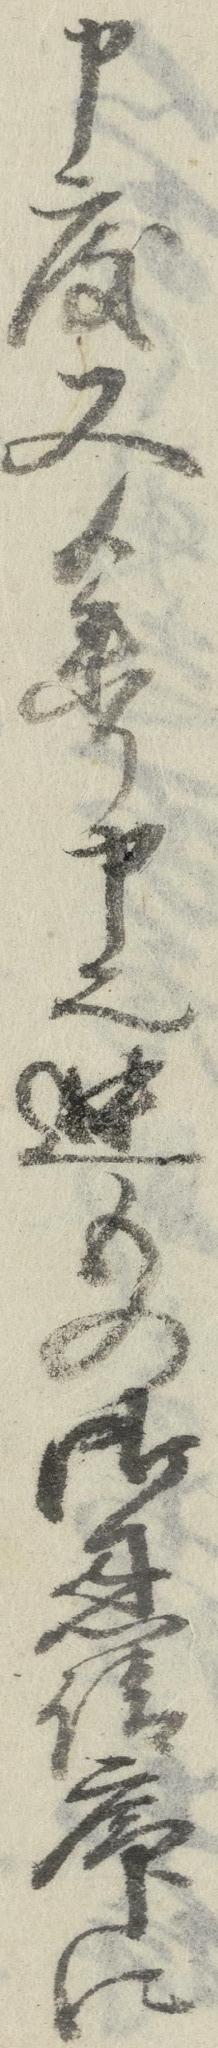申度又候参り申也迚もの御忍請序に
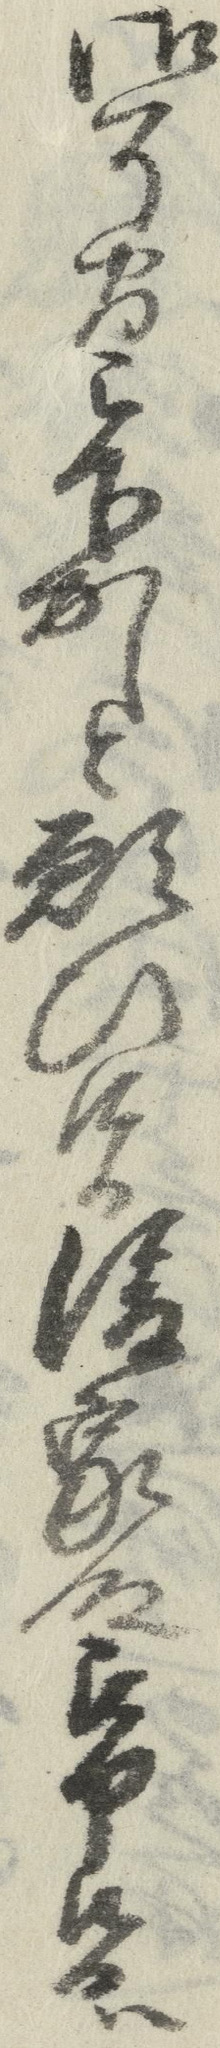御了間被下かしと願ひける後家殿被申けるは
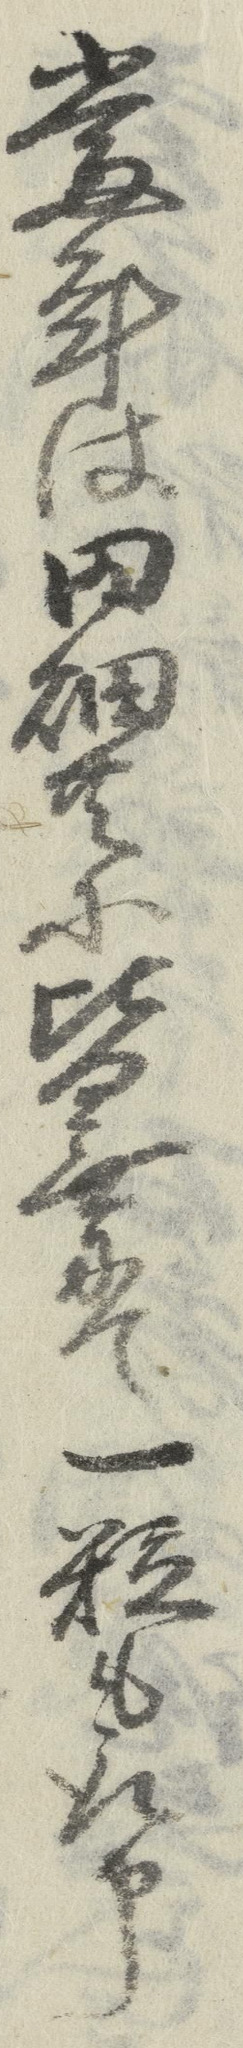当年は田畑共に皆無にて一粒も取申
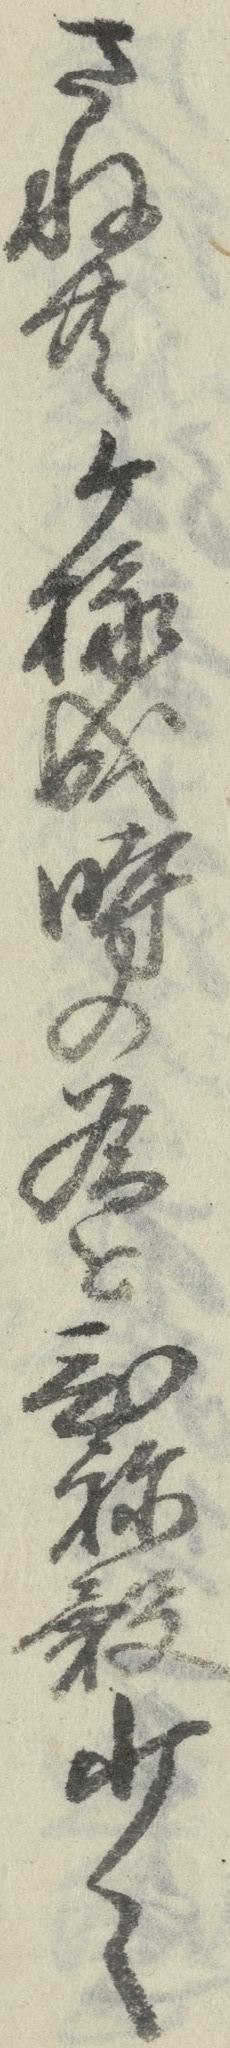さね共ケ様成時の為とひね穀少々
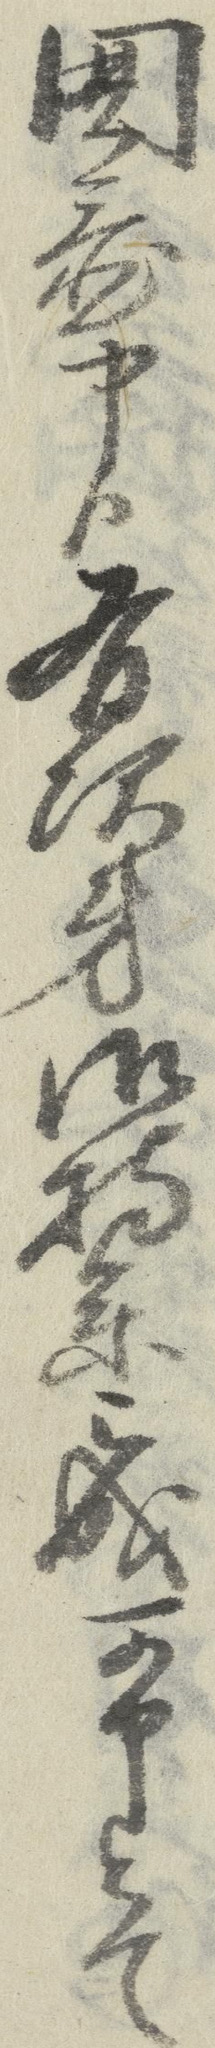囲置申候有次第御持参被成可申とて

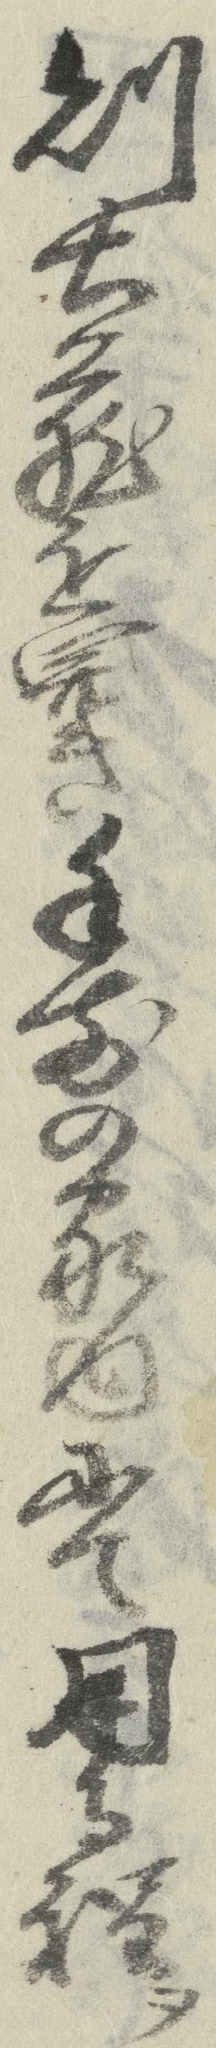則土蔵を開き手前の家内にて用る程ヲ
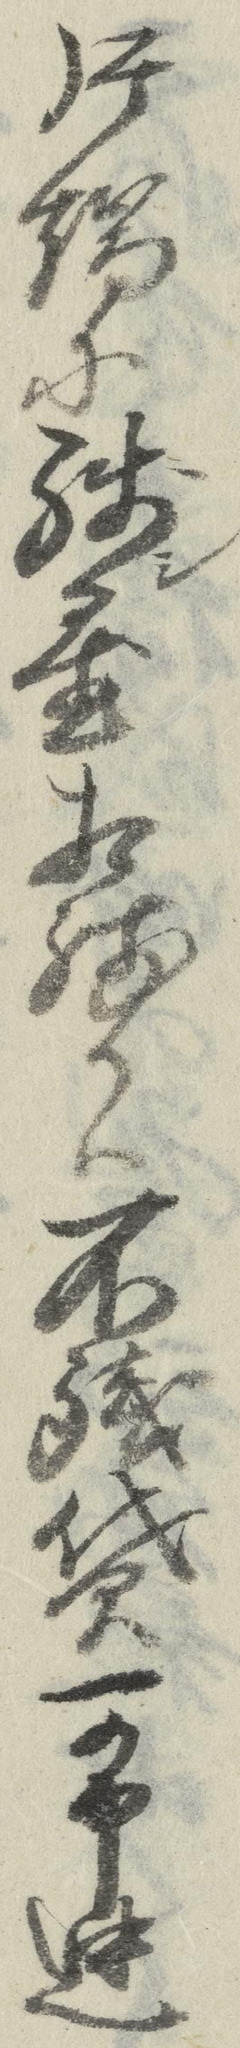片端に残置相残りは不残貸可申迚
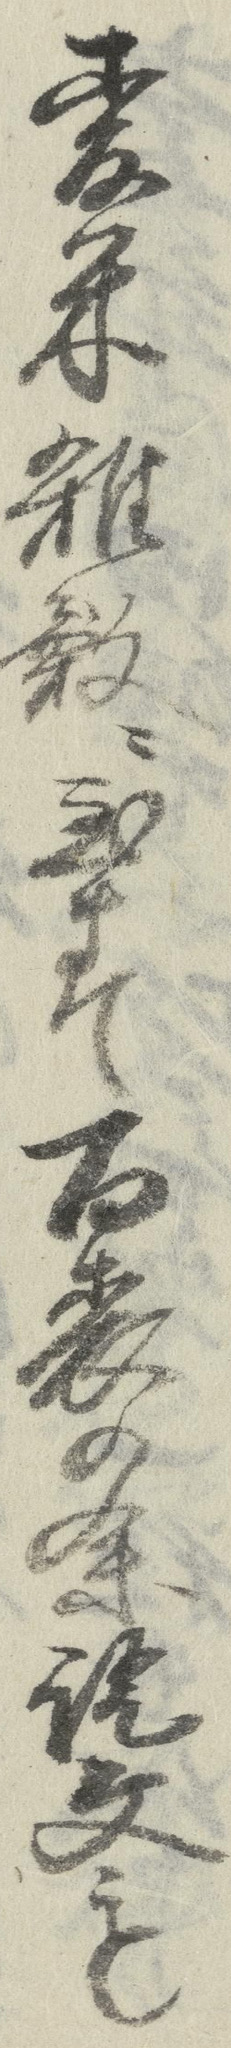麦米雑穀に至まて百表の余証文も
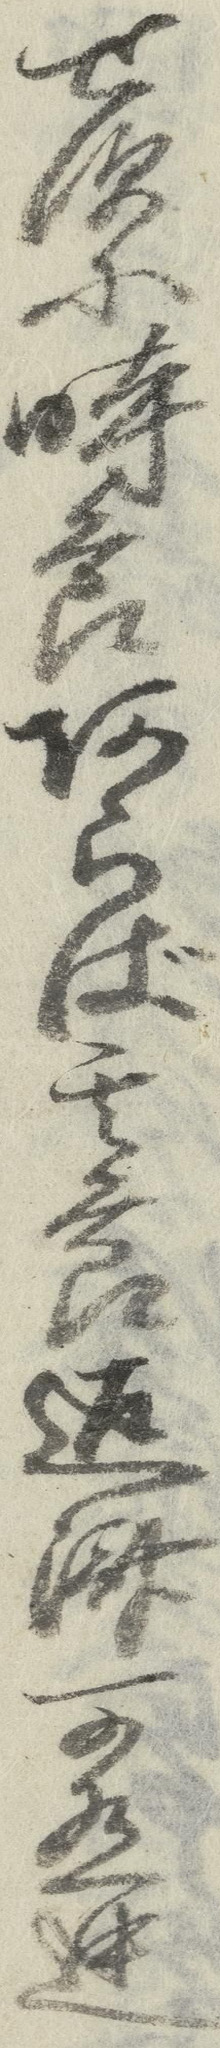せすに時節あらば其節返済可有迚
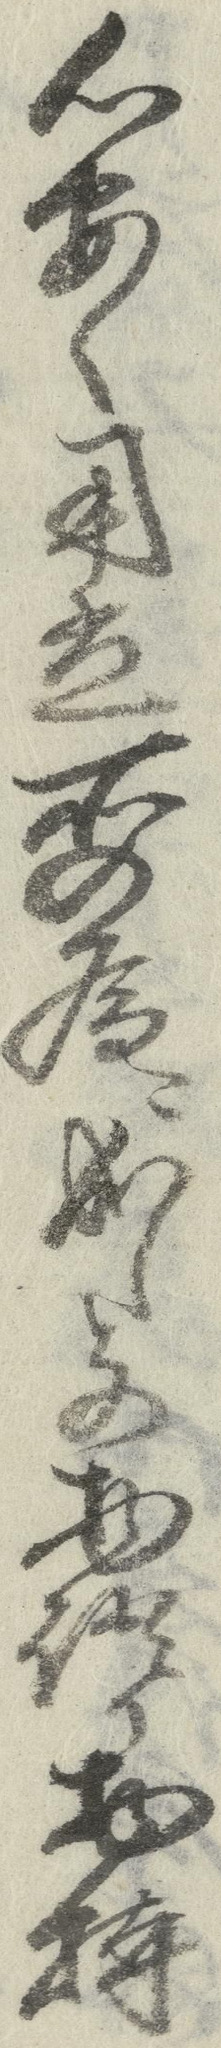心安く用立所の為に成しとの物礼り物持
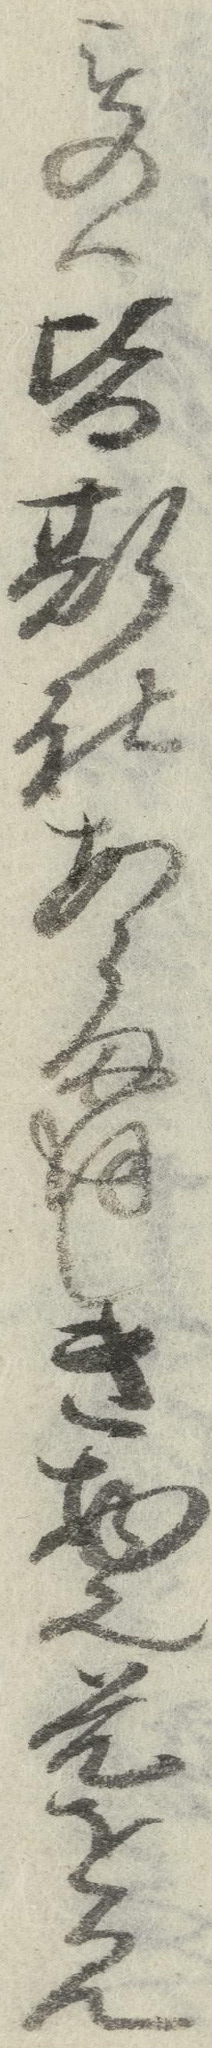ものは皆斯社あらまほしき物也是を見
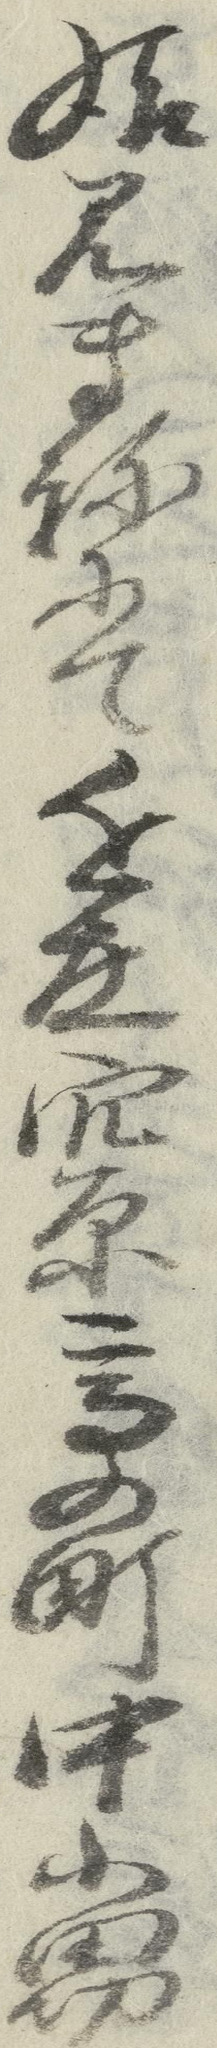様見まねにて近在穴原高の町中小田切
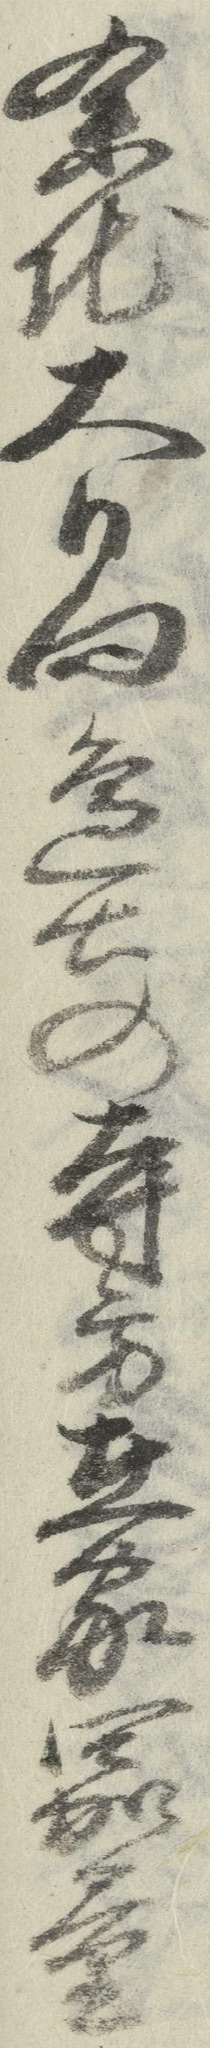条地大日向邊土の寺方在家冥？加量
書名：浅間大焼騒動記　中
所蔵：東京大学地震研究所図書室 Earthquake Research Institute Library, The University of Tokyo, JAPAN
